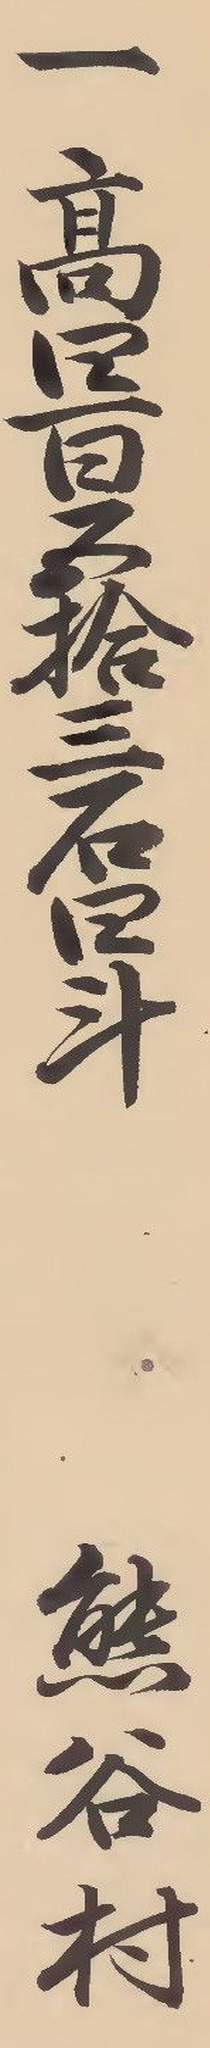一高四百五拾三石四斗熊谷村
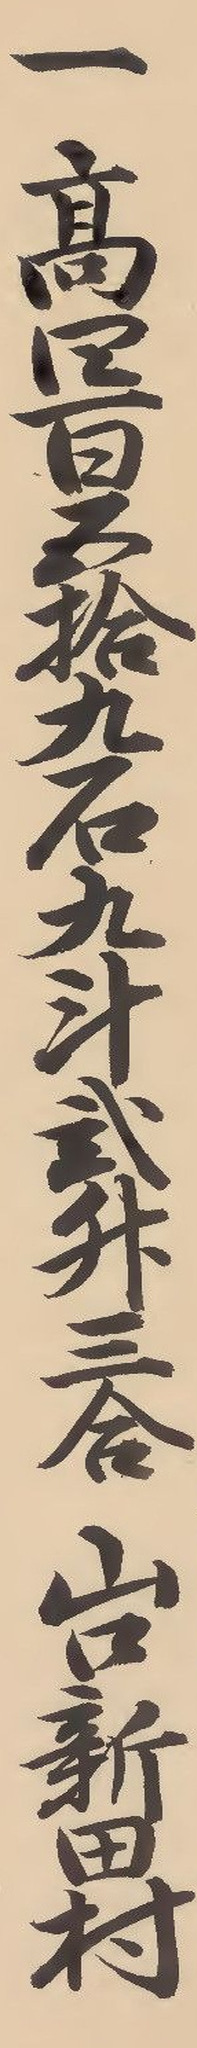一高四百五拾九石九斗弐升三合山口新田村
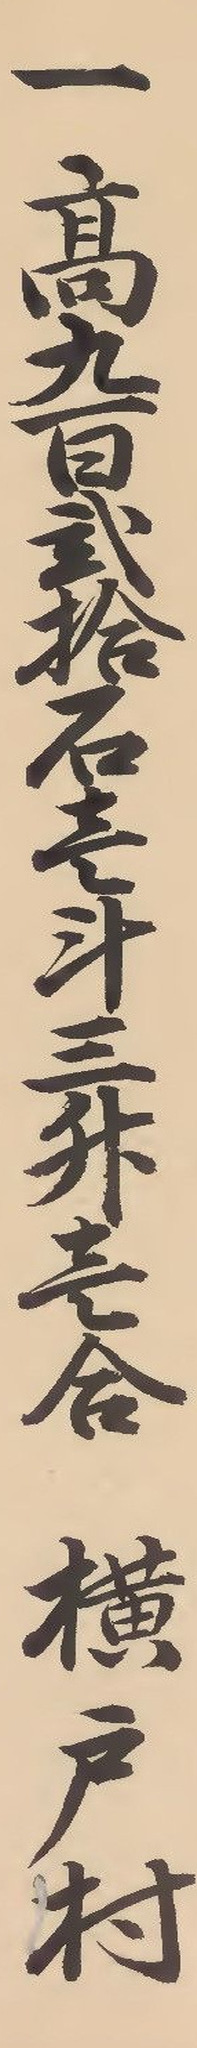一高九百弐拾石壱斗三升壱合横戸村
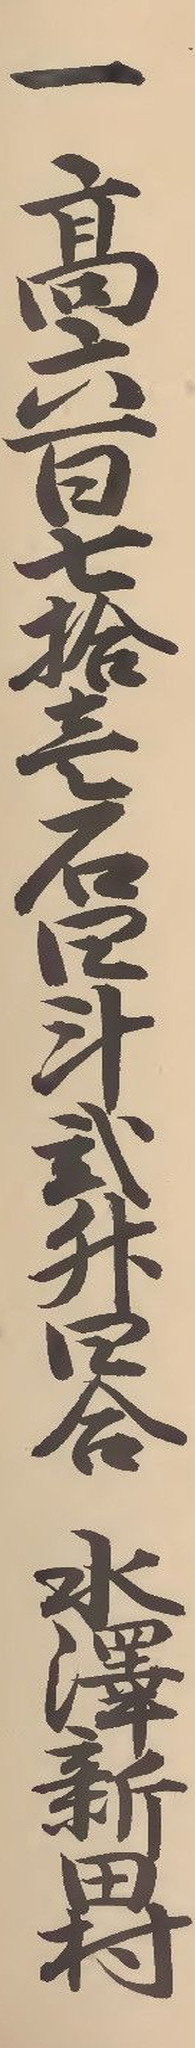一高六百七拾壱石四斗弐升四合水沢新田村
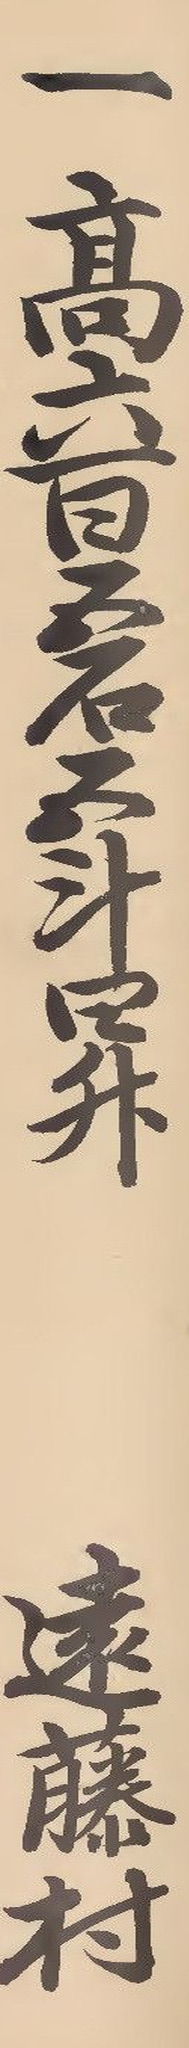一高六百五石五斗四升遠藤村
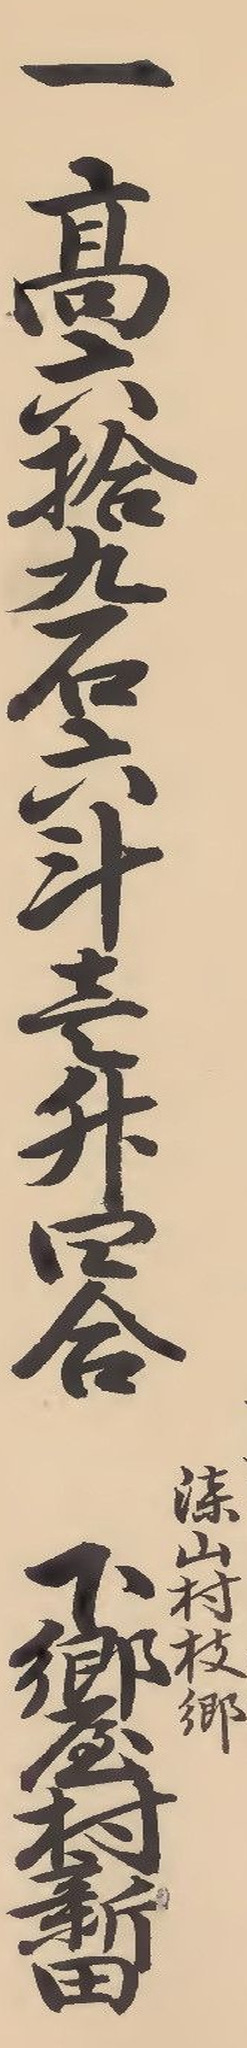一高六拾九石六斗壱升四合下郷屋村新田
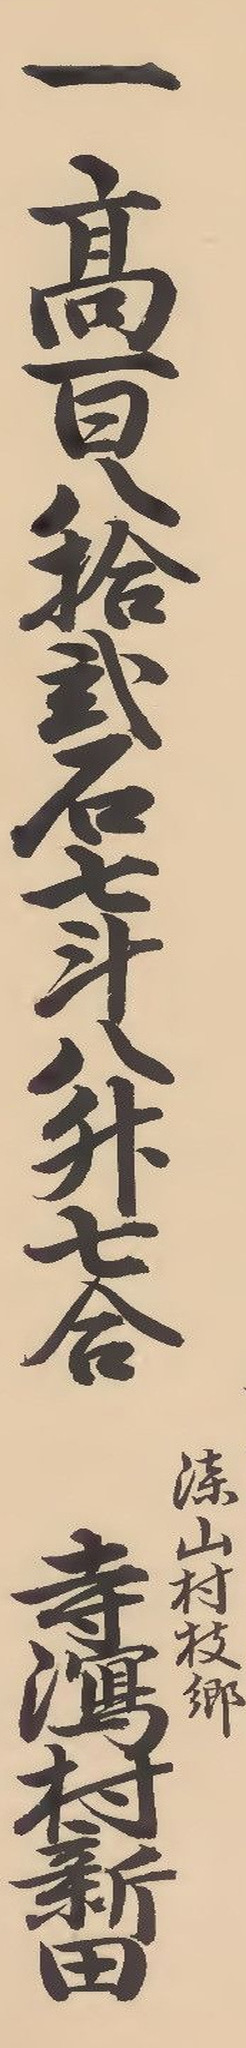一高百八拾弐石七斗八升七合寺潟村新田
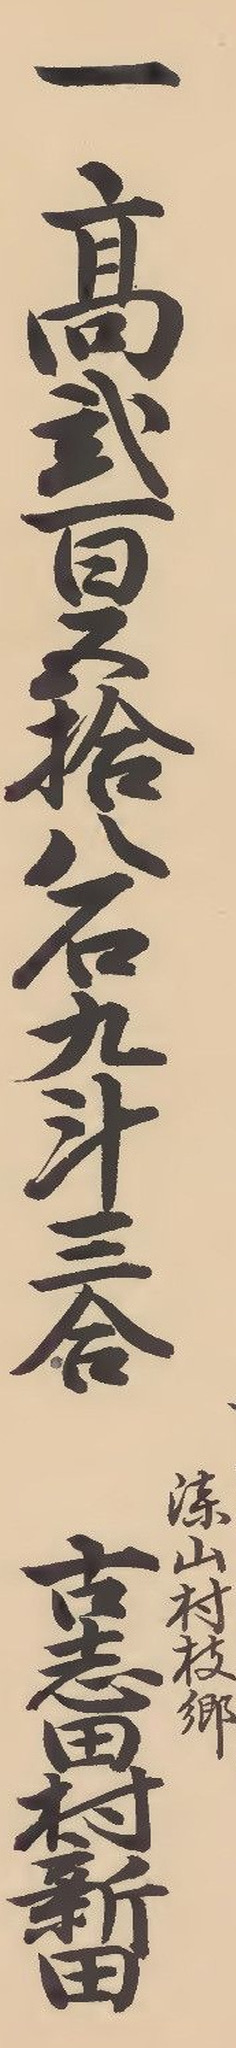一高弐百五拾八石九斗三合古志田村新田

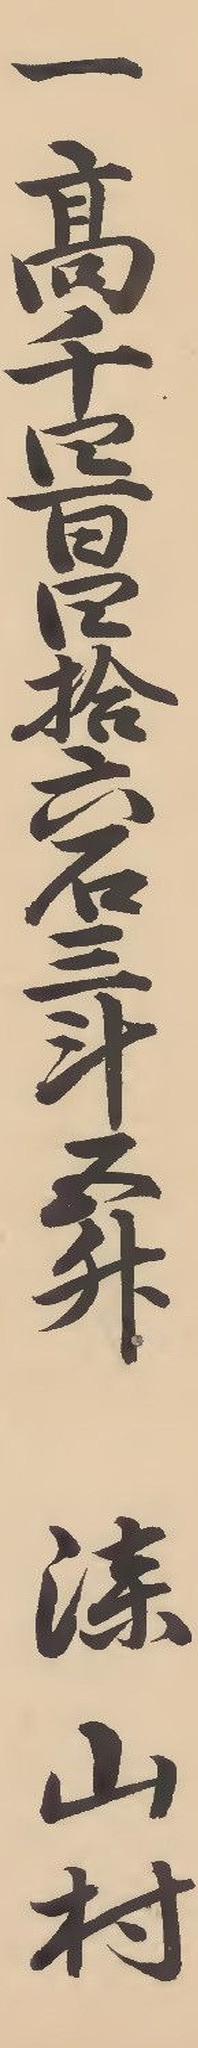一高千四百四拾六石三斗五升漆山村
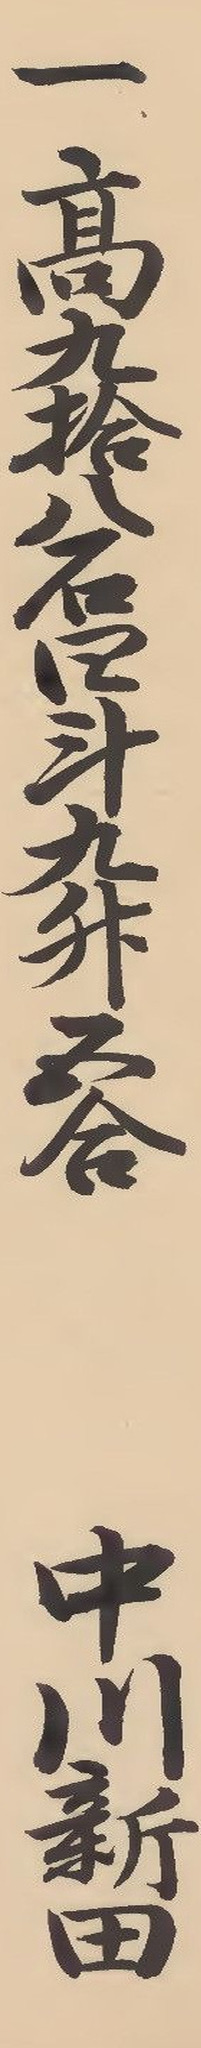一高九拾八石四斗九升五合中川新田
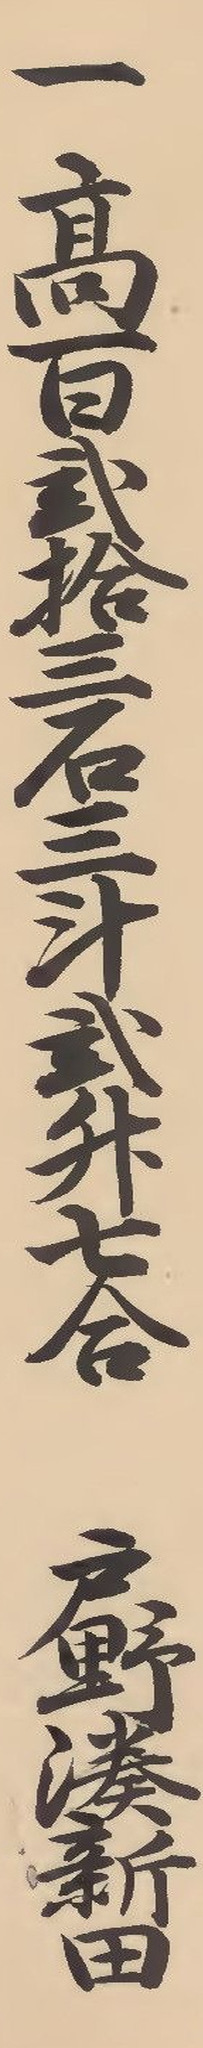一高百弐拾三石三斗弐升七合戸野湊新田
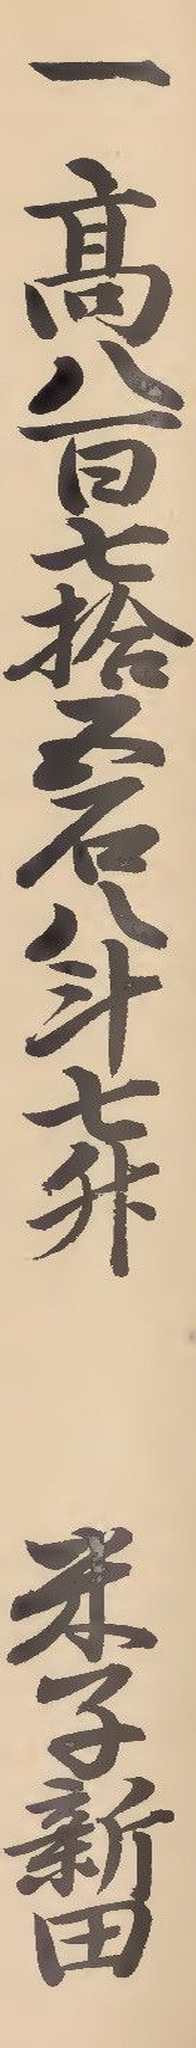一高八百七拾五石八斗七升米子新田
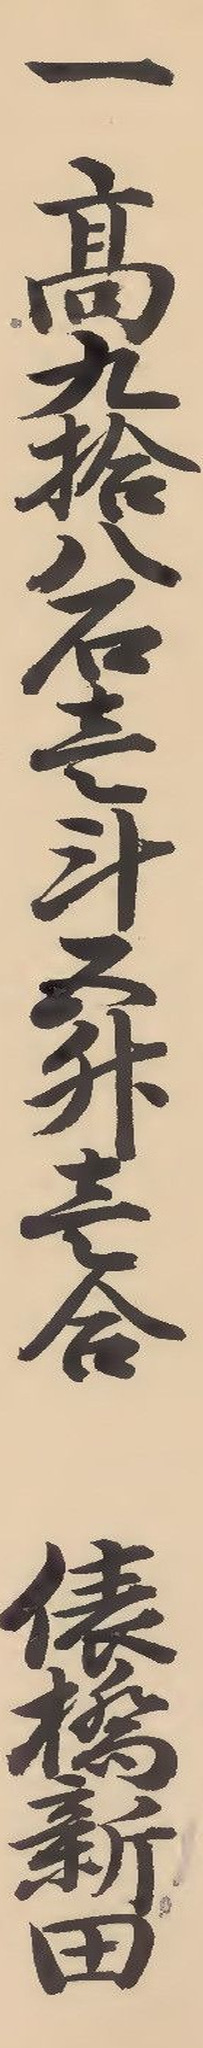一高九拾八石壱斗五升壱合俵橋新田
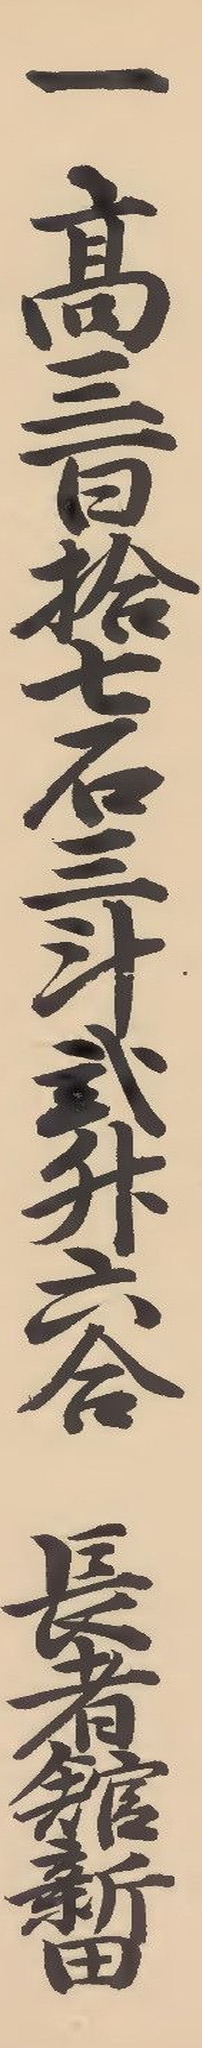一高三百拾七石三斗弐升六合長者舘新田
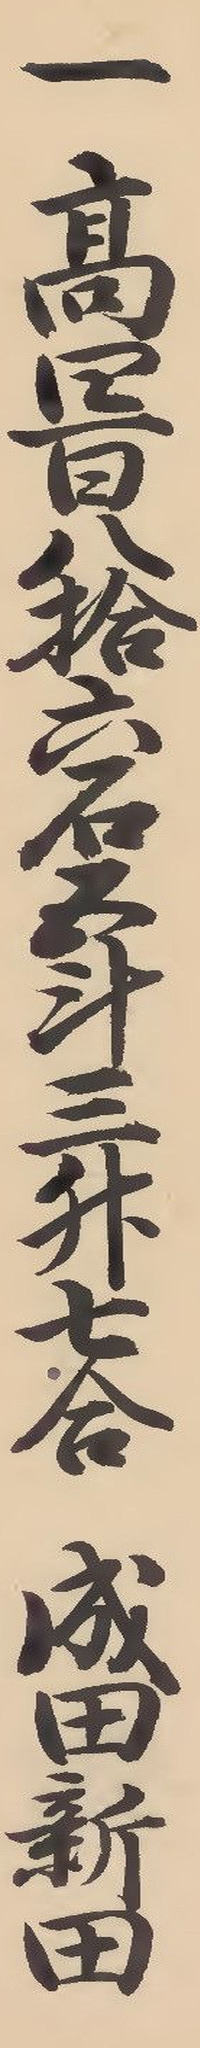一高四百八拾六石五斗三升七合成田新田

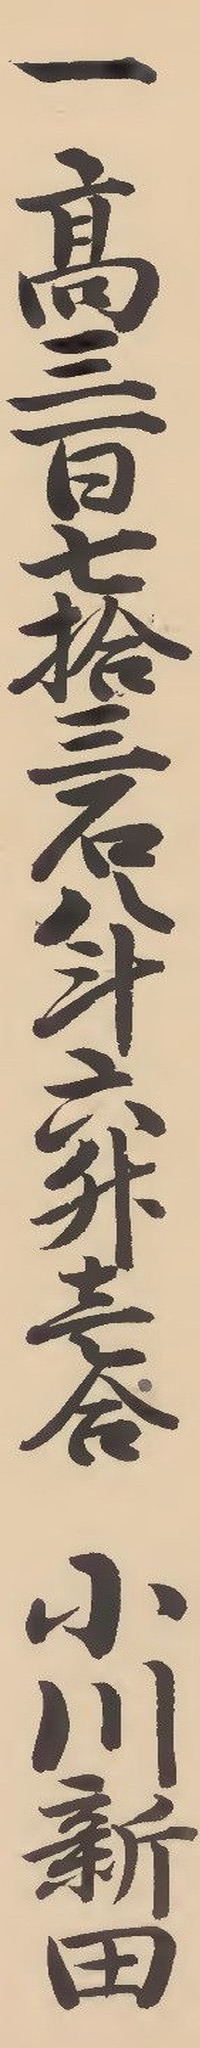一高三百七拾三石八斗六升壱合小川新田
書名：越後国郷帳　下
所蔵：国立公文書館 National Archives of Japan
